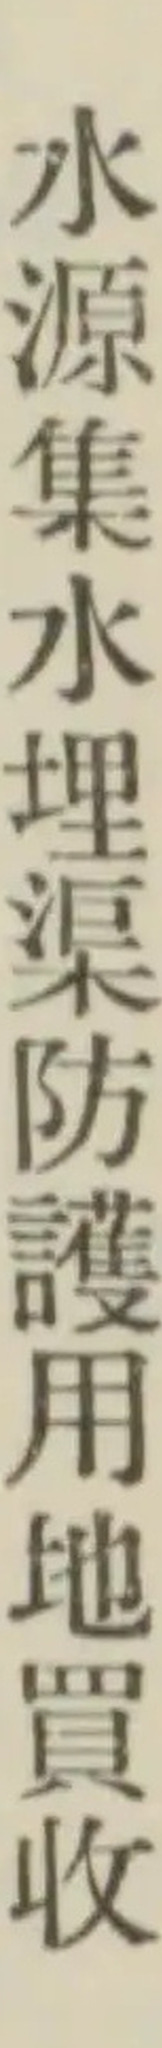水源集水埋渠防護用地買収
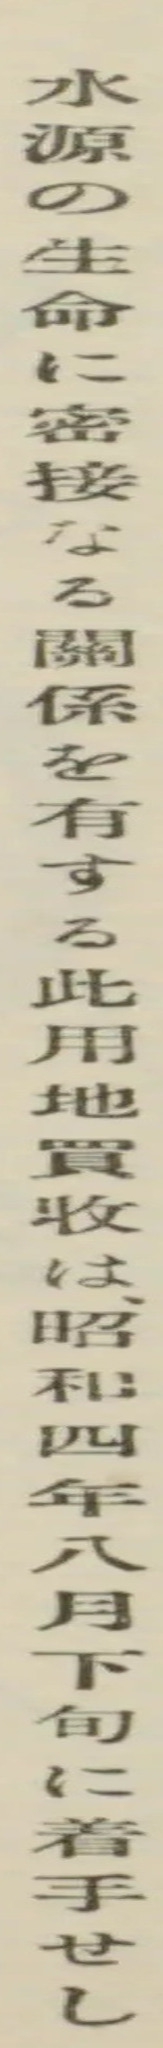水源の生命に密接なる関係を有する此用地買収は、昭和四年八月下旬に着手せし
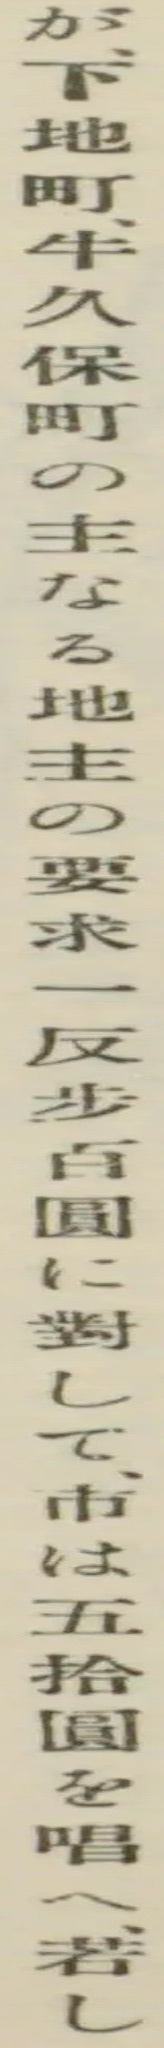が、下地町、牛久保町の主なる地主の要求一反歩百円に対して、市は五拾圓を唱へ、若し
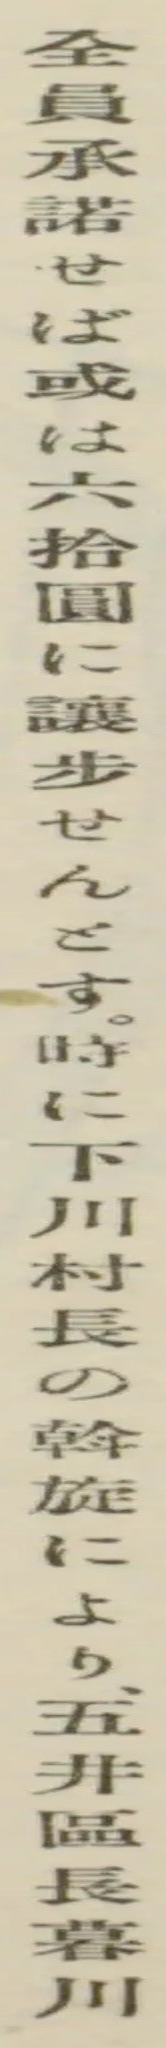全員承諾せば或は六拾圓に譲歩せんとす。時に下川村長の斡旋により、五井区長暮川
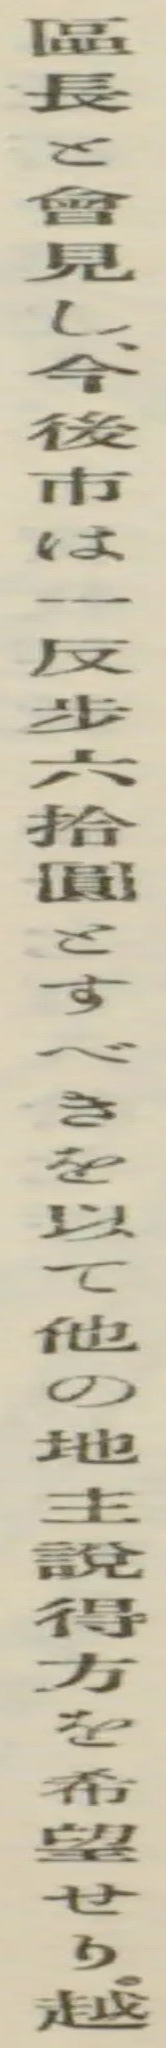区長と会見し、今後市は一反歩六拾圓とすべきを以て他の地主説得方を希望せり。越
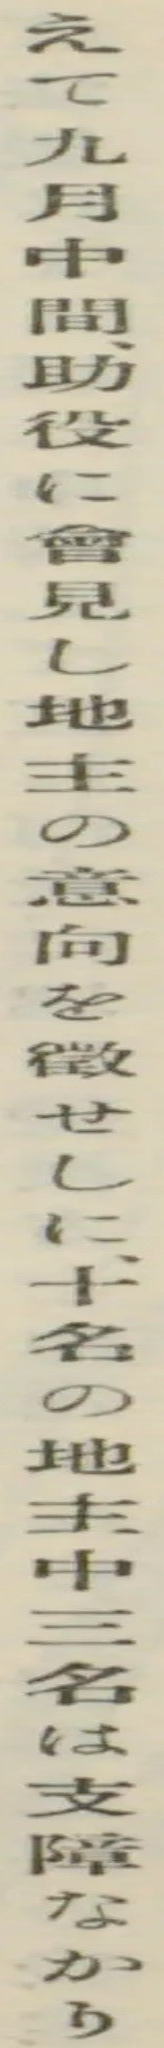えて九月中間、助役に会見し地主の意向を徴せしに、十名の地主中三名は支障なかり
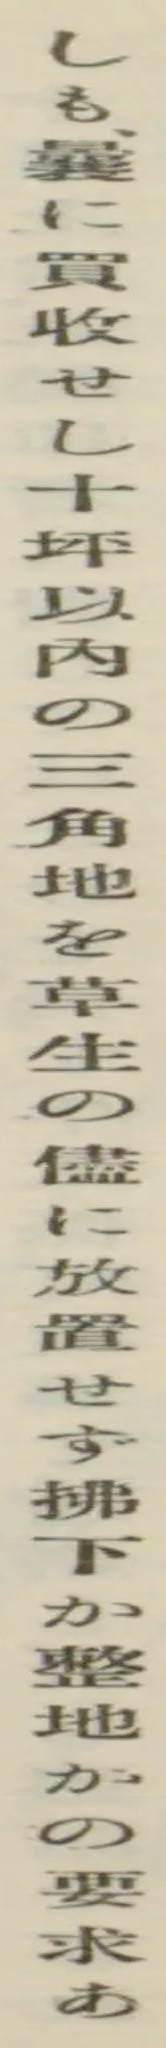しも、曩に買収せし十坪以内の三角地を草生の儘に放置せず拂下か整地かの要求あ
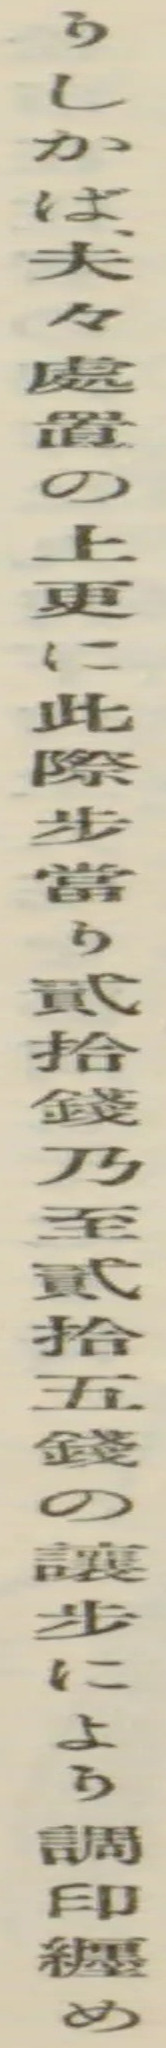りしかば、夫々処置の上更に此際歩当り貳拾銭乃至貳拾五銭の譲歩により調印纏め
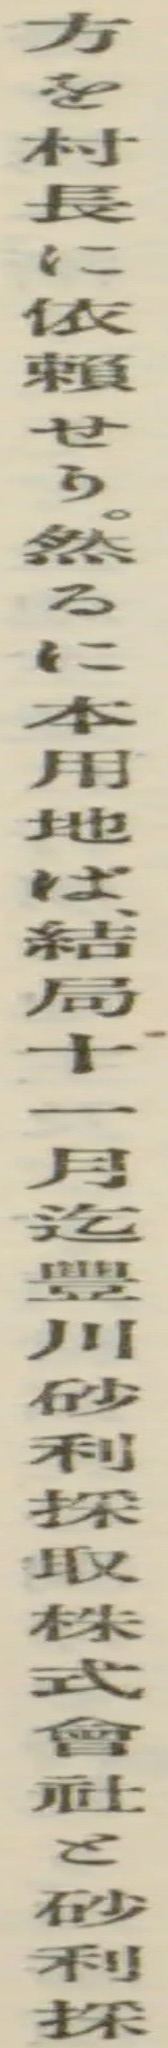方を村長に依頼せり。然るに本用地は、結局十一月迄豊川砂利採取株式会社と砂利採
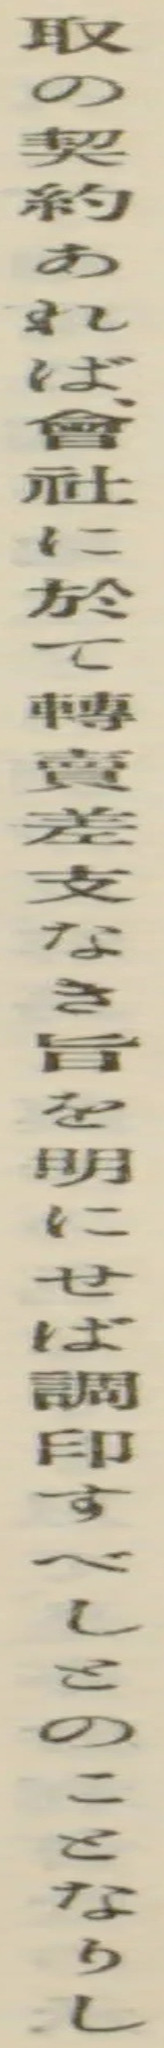取の契約あれば、会社に於て転売差支なき旨を明にせば調印すべしとのことなりし
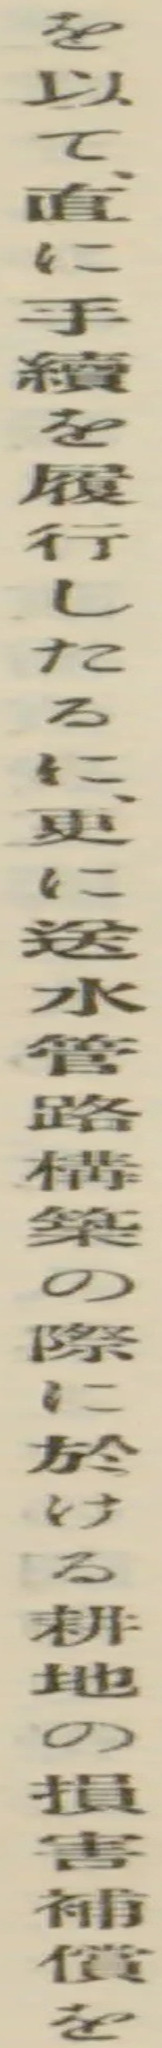を以て、直に手続きを履行したるに、更に送水管路構築の際に於ける耕地の損害補償を

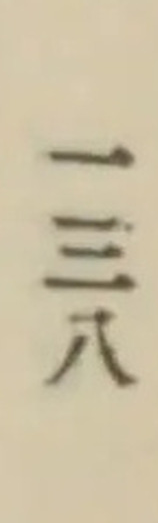一三九
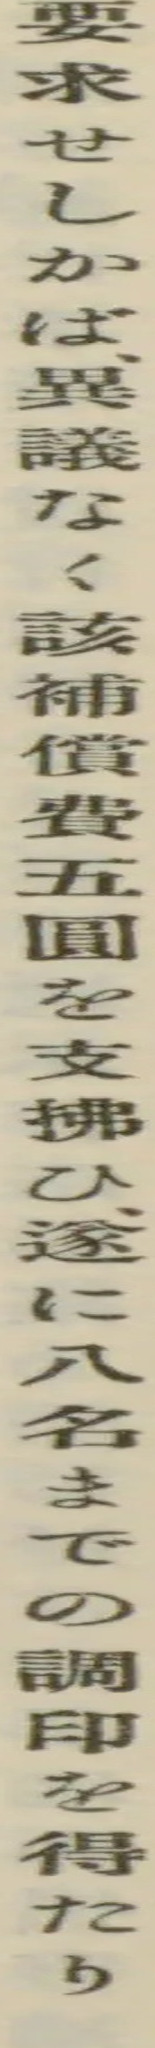要求せしかば、いぎな異議なく該補償費五圓を支拂ひ、遂には八名までの調印を得たり
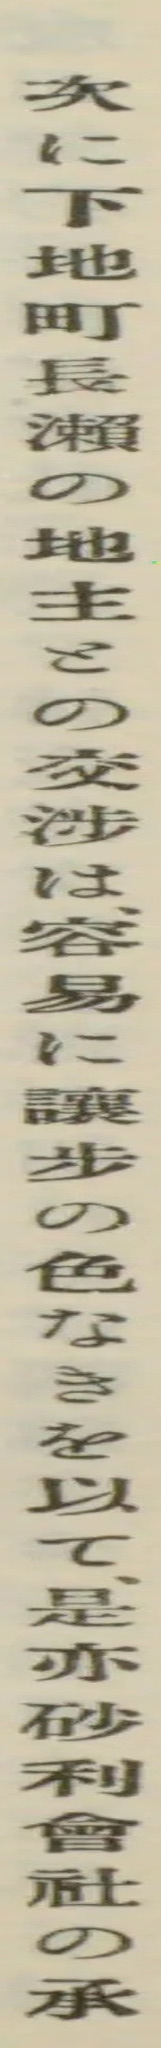次に下地町長瀬の地主との交渉は、容易に譲歩の色なきを以て、是亦砂利会社の承
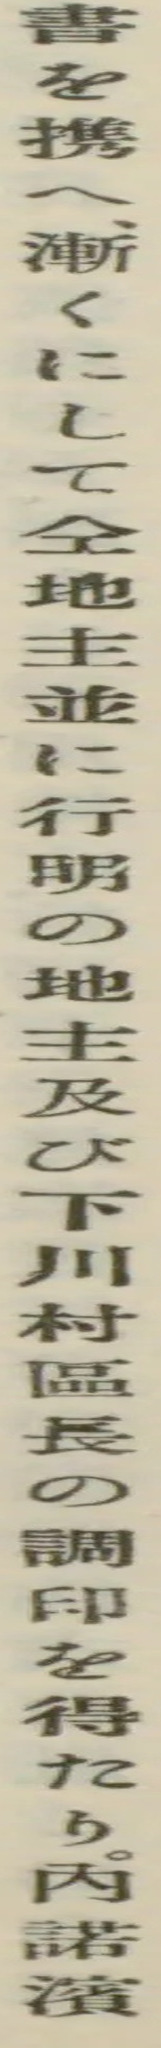書を携へ、漸くにして同地主並に行く明の地主お及び下川村区長の調印を得たり。内諾濱
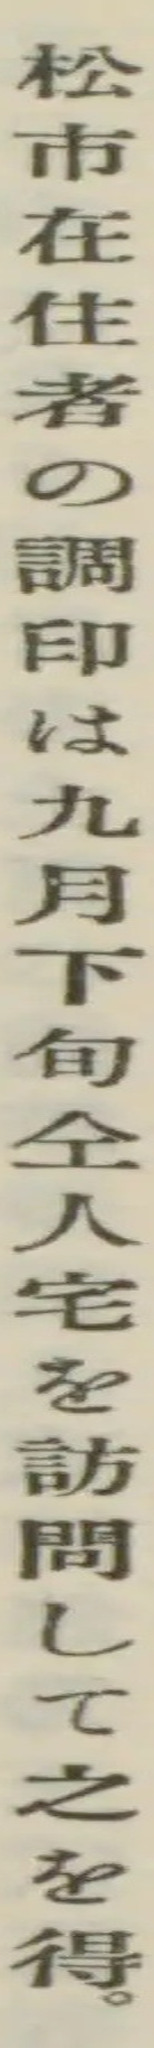松市在住者の調印は九月下旬同人宅を訪問して之を得。
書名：豊橋市水道誌
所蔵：国立国会図書館 National Diet Library, JAPAN
